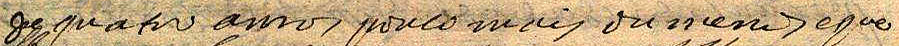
de quatro annos pouco mais ou menos e que
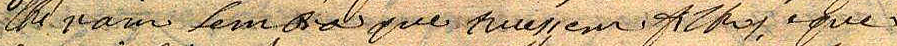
lhe nam lembra que tiuessem filhos, e que
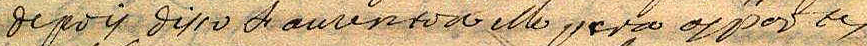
depois disso se auzentou elle para as partes
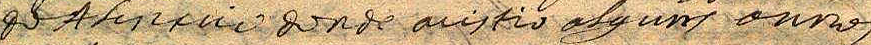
do Alenteio donde acistio alguns annos
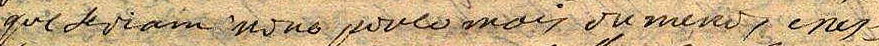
que seriam noue pouco mais ou menos e nes
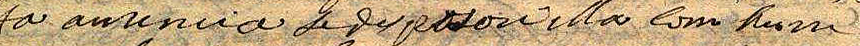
ta auzencia se desposou ella com hum
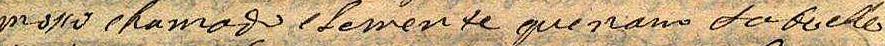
mosso chamado clemente que nam sabe elle
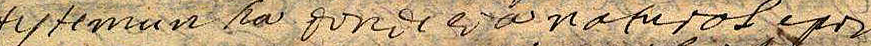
testemunha donde era natural e por
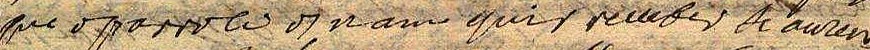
que o parroco os nam quis receber se auzen
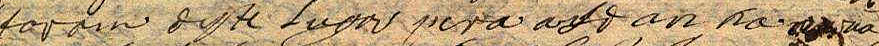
taram deste lugar para a Idanha __ua
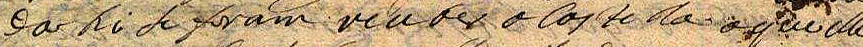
e dahi se foram receber a Castella a que elle
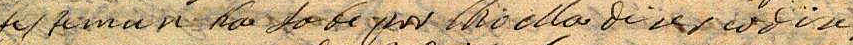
testemunha sabe por lho ella dizer e o dizer
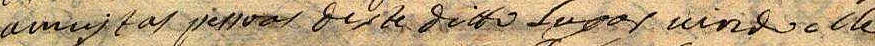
a mujtas pessoas deste ditto Lugar uindo elle
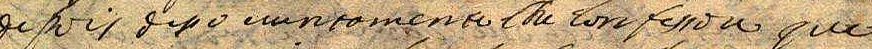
depois disso iuntamente lhe confessou que
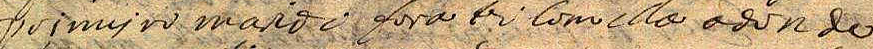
o primeiro marido fora ter com ella adonde
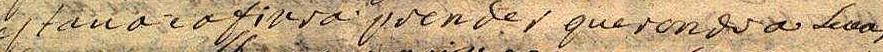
estaua e a fizera prender querendoa leuar
